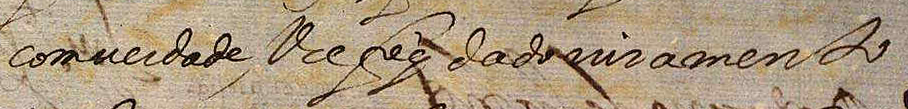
com uerdade lhe foy dado iuramento
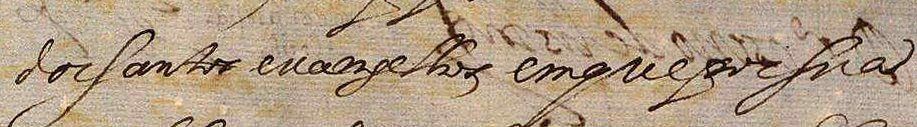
dos Santos euangelhos em que poz sua
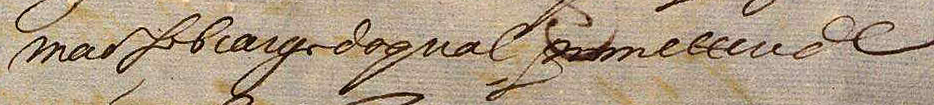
maõ sob cargo do qual prometteu de
